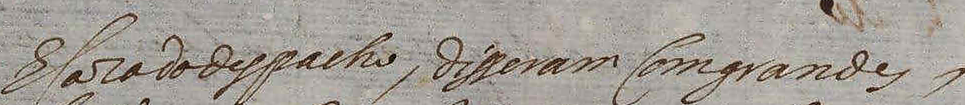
E Caza do despacho, disseram Com grandes
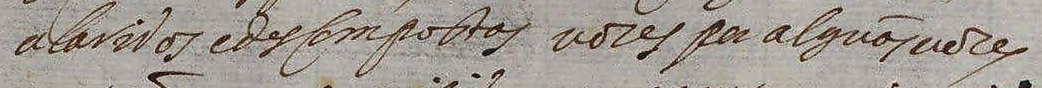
alaridos e descompostas uozes por alguās uezes
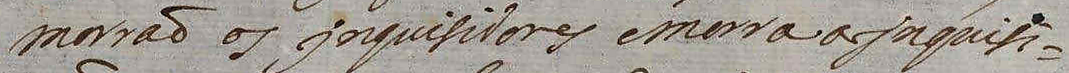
morraõ os jnquisidores e morra a jnquisi
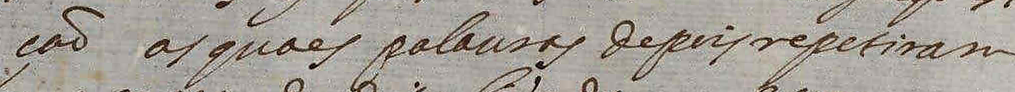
çaõ as quaes palauras depois repetiram
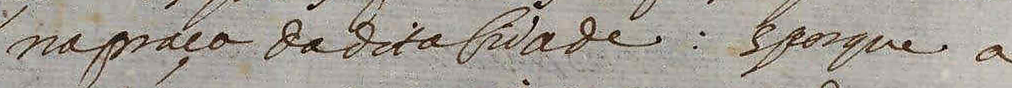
na praça da dita Cidade: E porque a
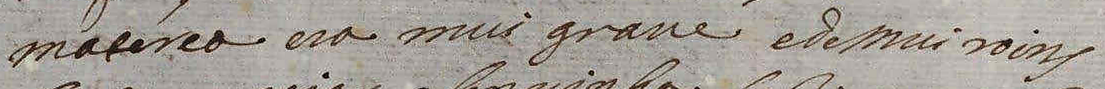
materea era mui grave e de mui roins
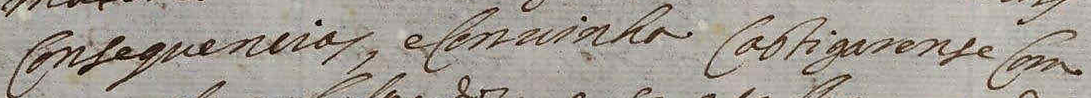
Consequencias, e Conuinha Castigarense Com
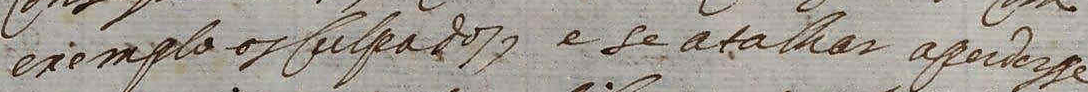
exemplo os Culpados, e se atalhar a perdersse
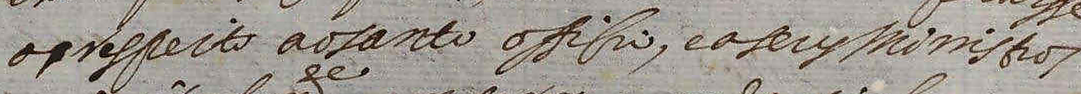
o_ respeito ao santo officio, e a seus Ministros
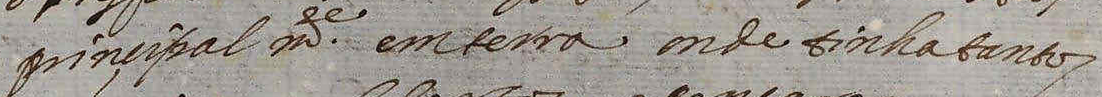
principalm.te em terra onde tinha tantos
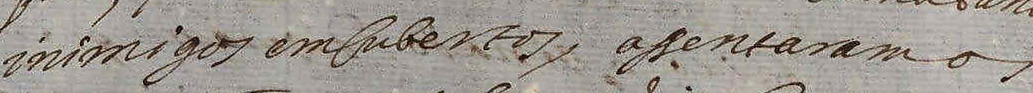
inimigos emcubertos, assentaram os
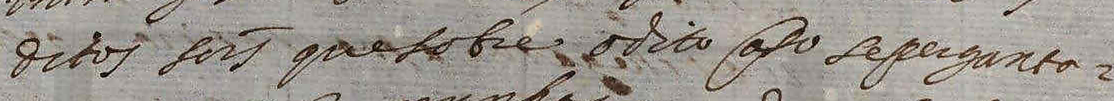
ditos sōrs que sobre o dito Caso se pergunta
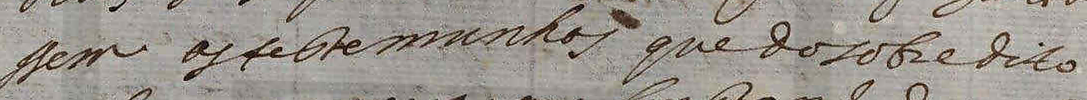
ssem as testemunhas que do sobredito
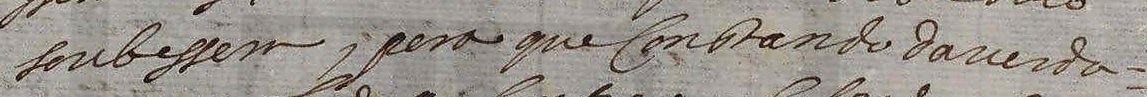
soubessem, pera que Constando da uerda
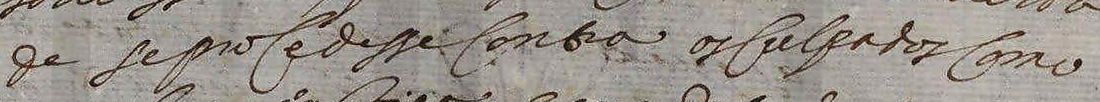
de se proCedesse Contra os Culpados Como
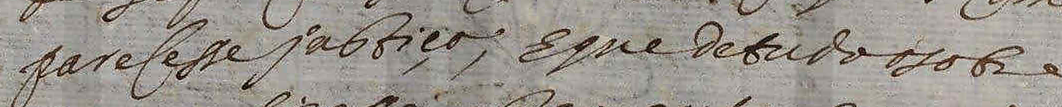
pareCesse justiça, E que de tudo o sobre
